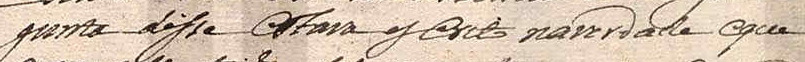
gunta disse estava escrito na verdade e que
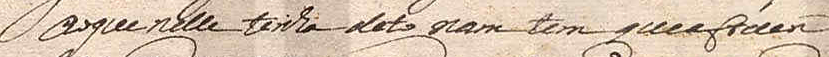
ao que nelle tinha dito nam tem que acrecen
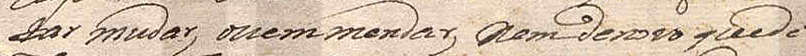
tar mudar, ou emmendar, nem de novo que di
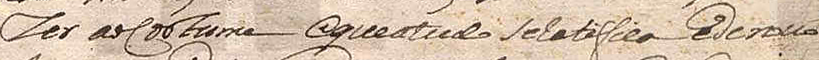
Zer ao Costume e que a tudo se ratifica e de novo
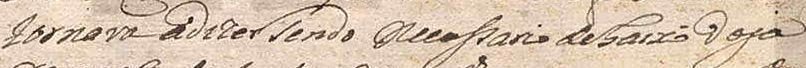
tornava a dizer sendo necessario debaixo de ju
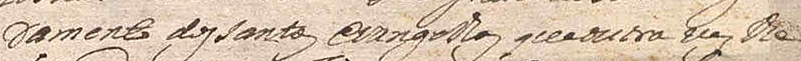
ramento dos santos Evangelhos que outra uez lhe
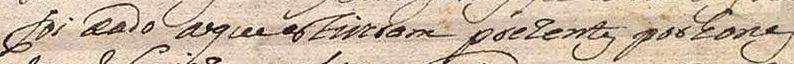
foi dado ao que estiveram prezentes por hones
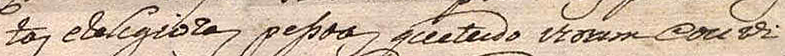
tas e Religiozas pessoas que tudo viram e ouvi
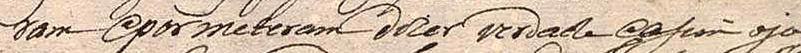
ram e pormeteram dizer verdade e asim o ju
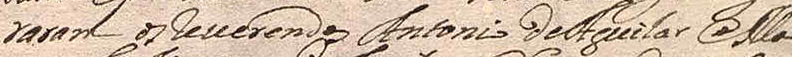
raram os Reverendos Antonio de Aguilar E Ma
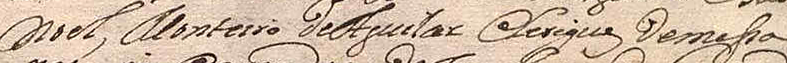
noel Monteiro de Aguilar Cleriguo de messa
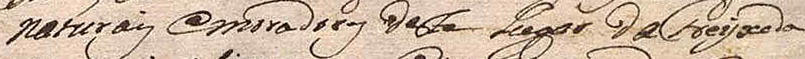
naturais e moradores deste lugar da Freyxeda
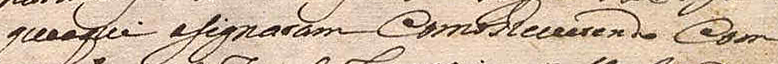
que aqui asignaram como Reuerendo Com
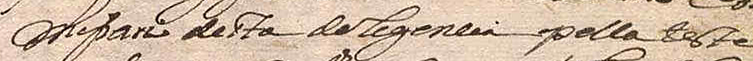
misario desta deligencia pella teste
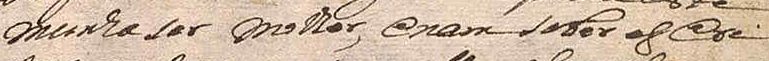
munha ser molher, e nam saber escre
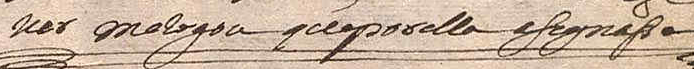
uer me rogou que por ella asignasse
